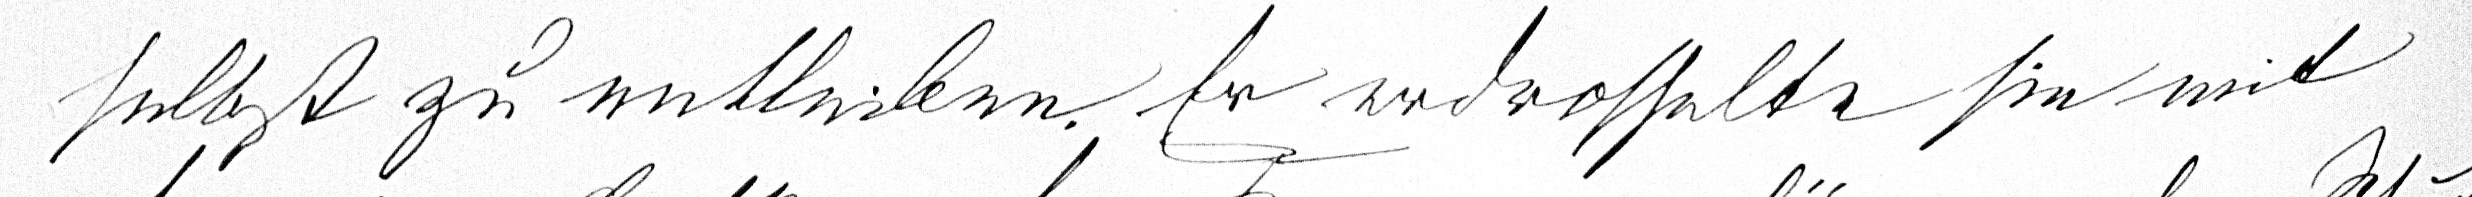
selbst zu entleiben. Er erdrosselte sie mit
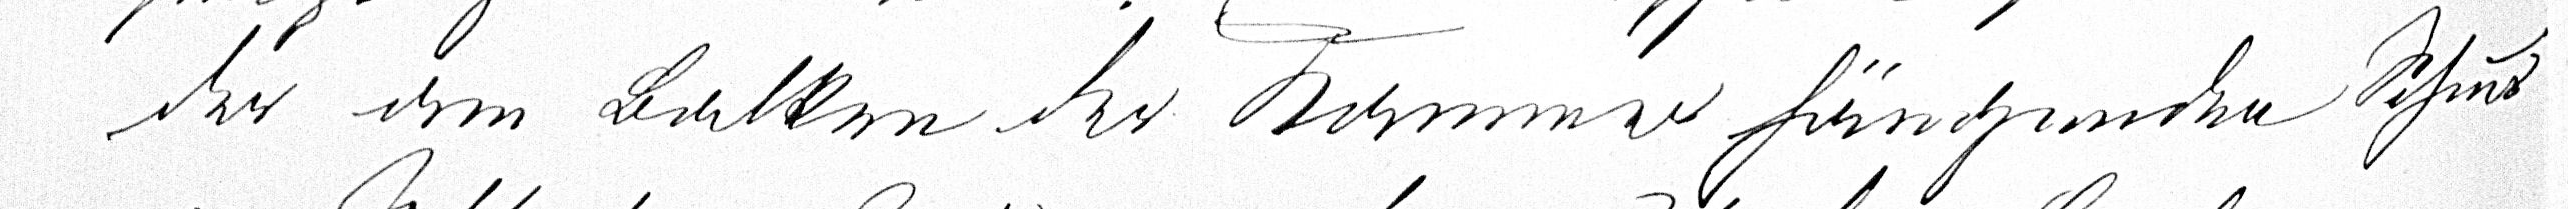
der dem Balken der Kammer hängenden Schnur
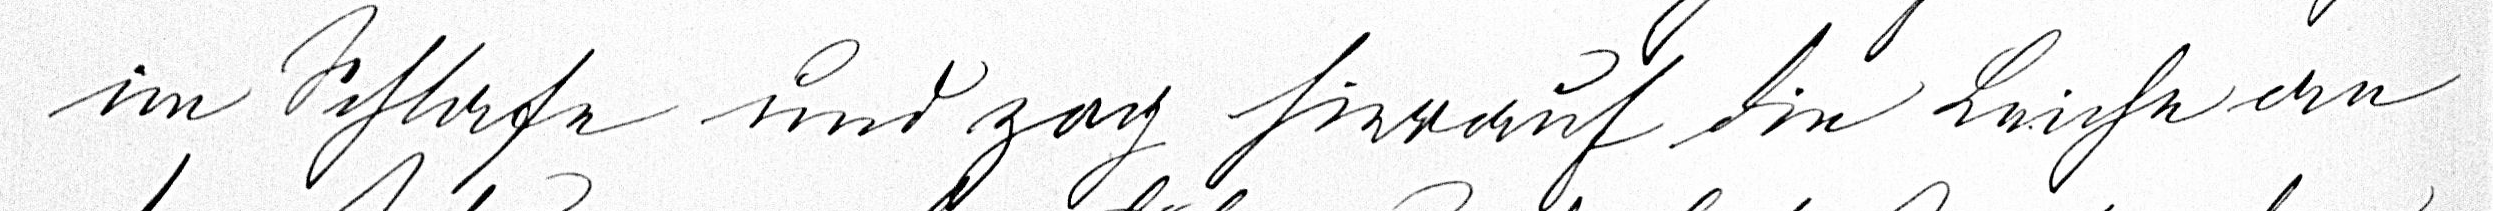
im Schlafe und zog hierauf die Leiche an
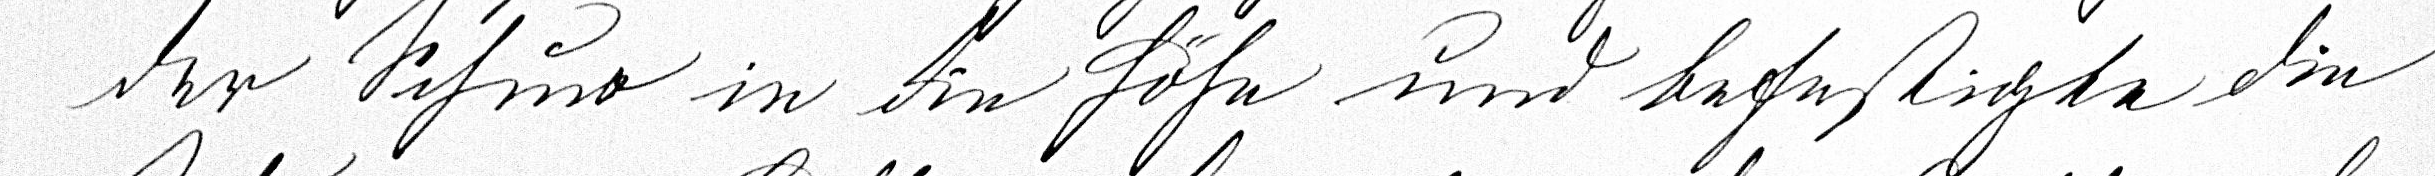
der Schuxx in die Höhe und befestigte die
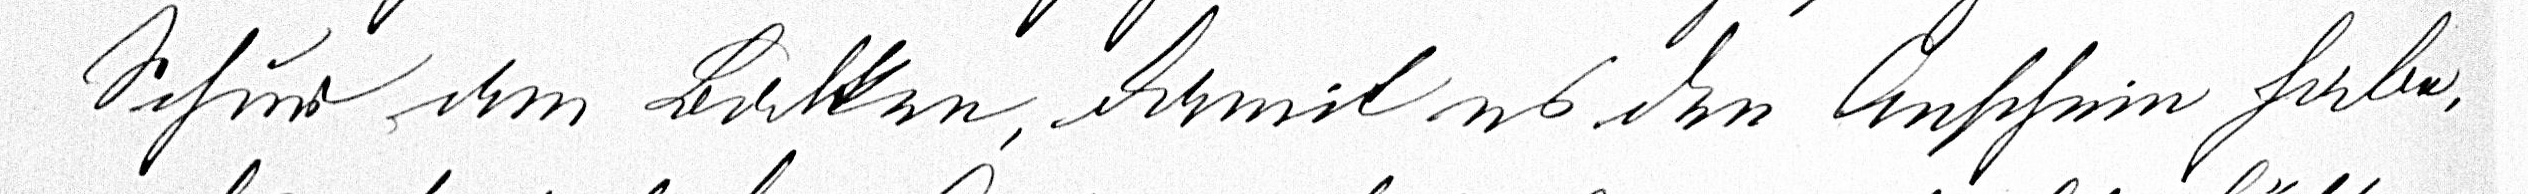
Schur am Balken, damit es den Anschein habe,
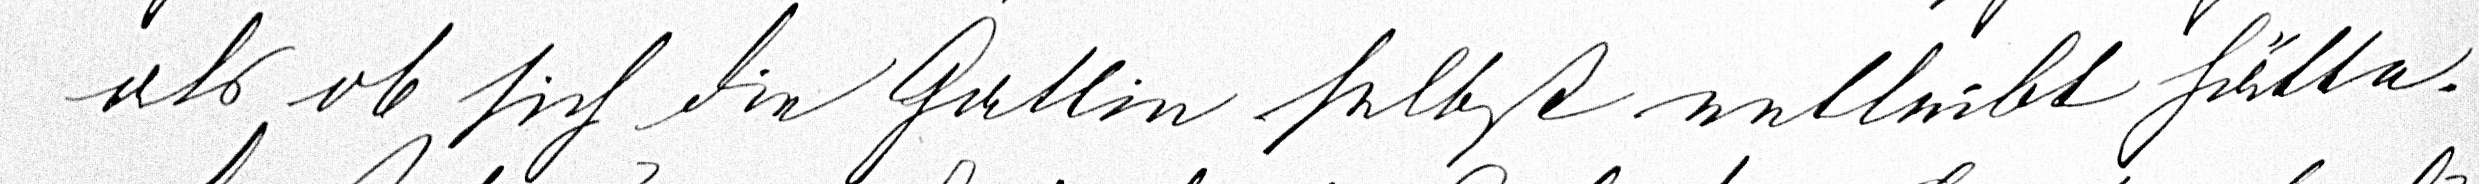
als ob sich die Gattin selbst entleibt hätte.
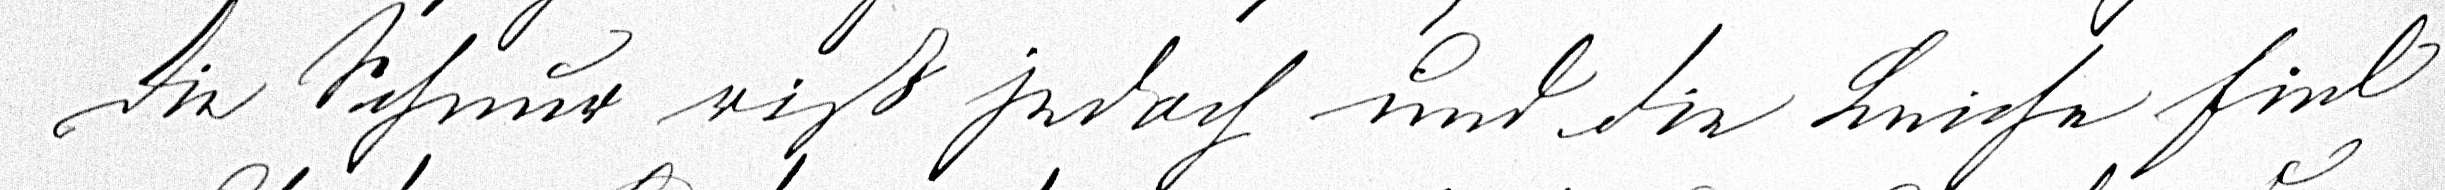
Die Schnur riß jedoch und die Leiche find
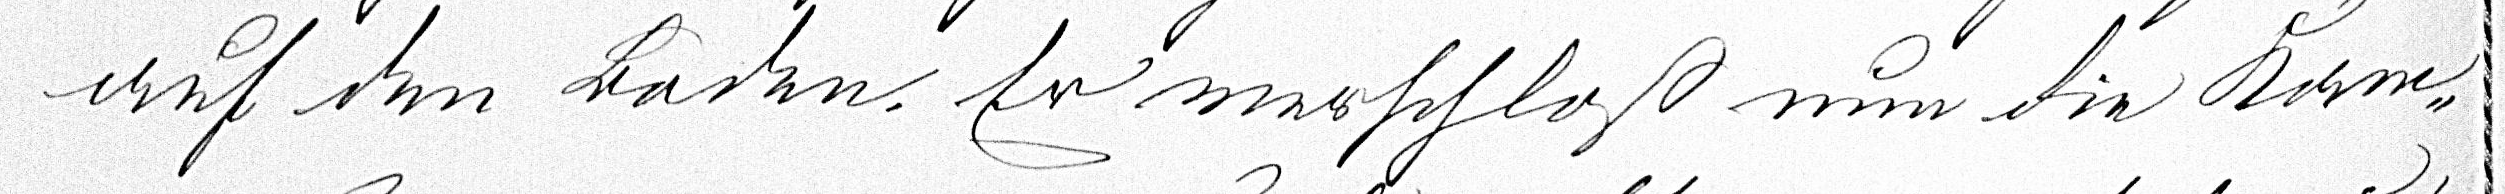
auf den Boden. Er merschloß nun die Kam¬
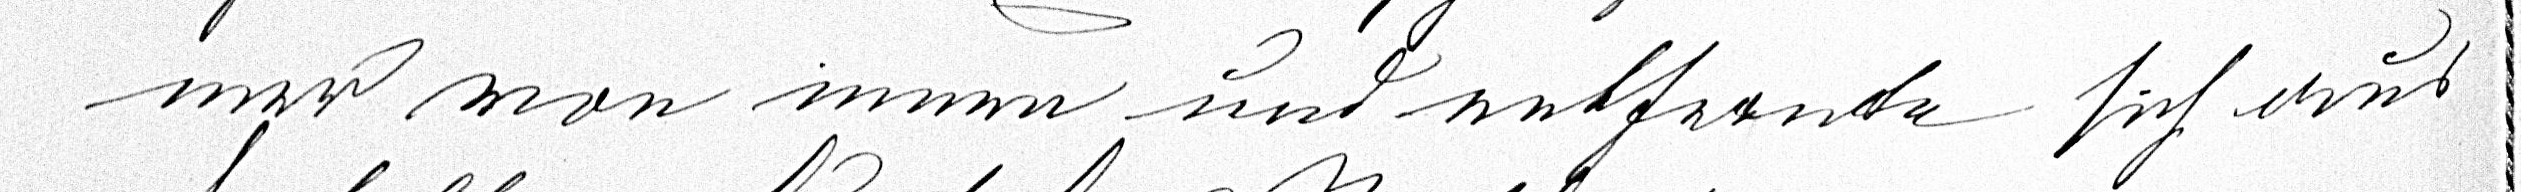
mer von innen und entfernte sich aus
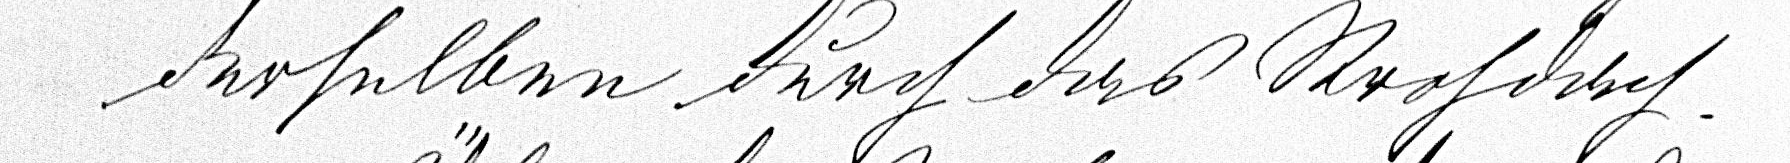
derselben durch das Strohdach.
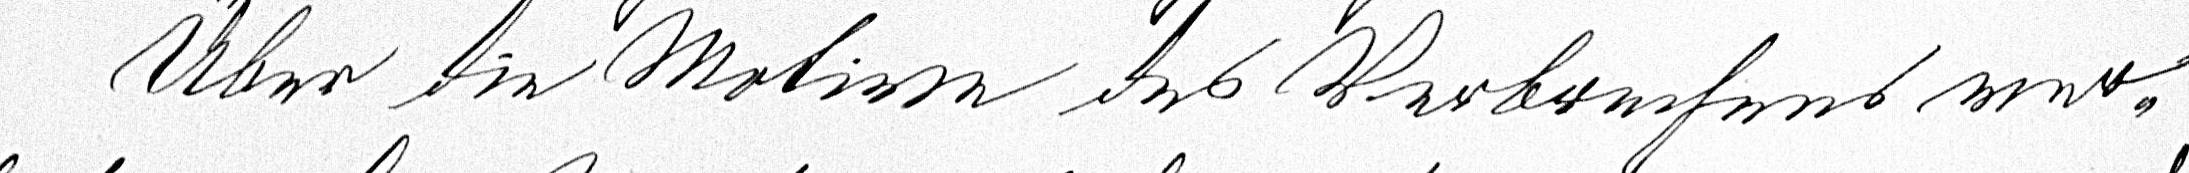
Über die Motive des Verbrechens ver¬
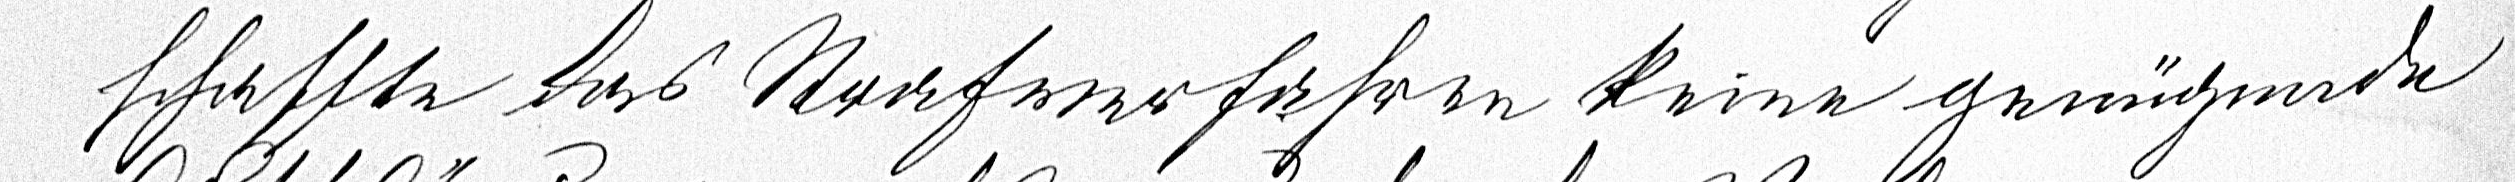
schaffte das Strafverfahren keine genügende
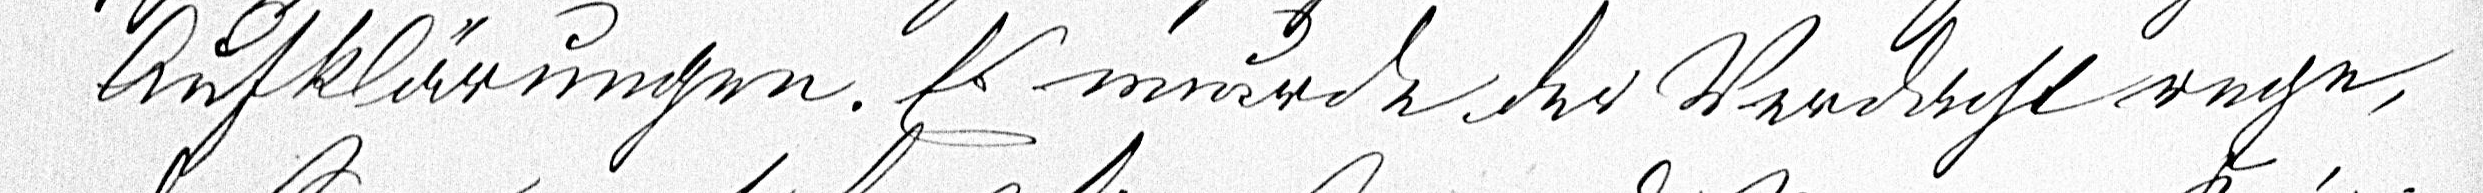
Aufklärungen. Es wurde der Verdacht rege,
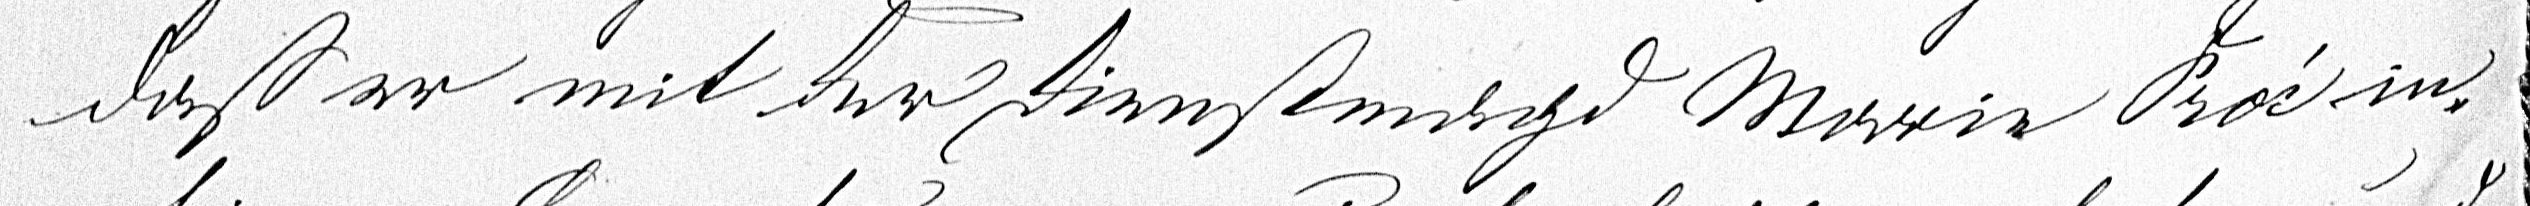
daß er mit der Dienstmagd Marie Proć in¬
